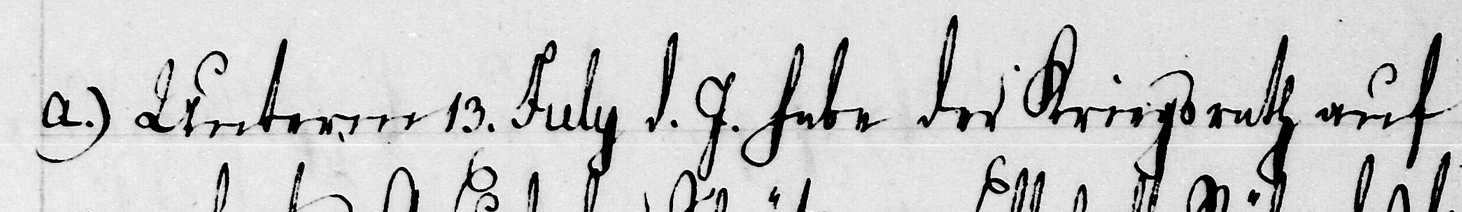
a.) Unterm 13. July d. J. habe der Kriegsrath auf
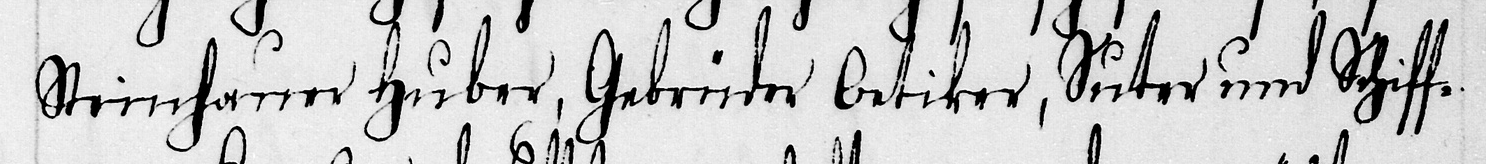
Steinhauer Huber, Gebrüder Oetiker, Suter und Schiff¬
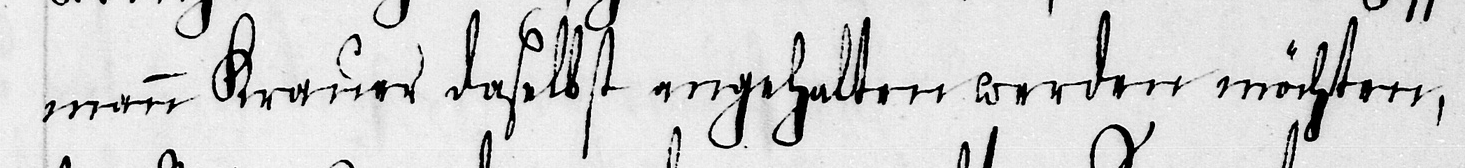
mann Krauer daselbst angehalten werden möchten,
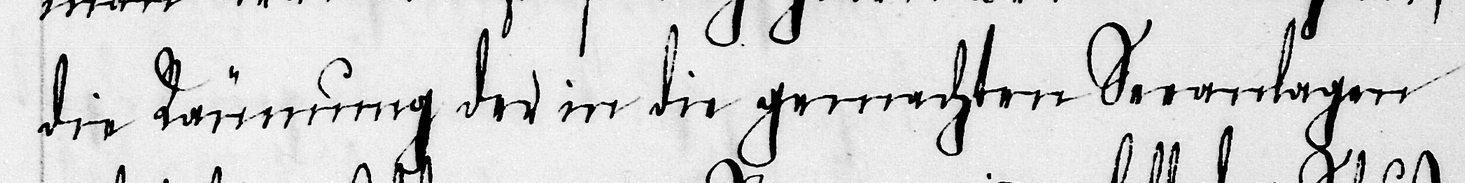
die Räumung der in die gemachten Seenanlagen
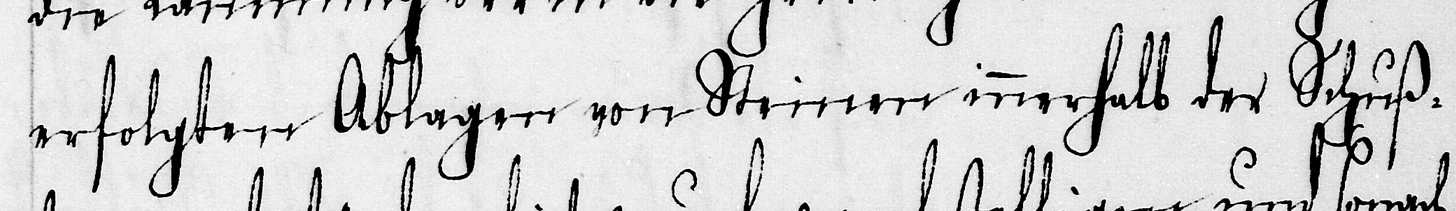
erfolgten Ablagen von Steinen innerhalb der Schuß¬
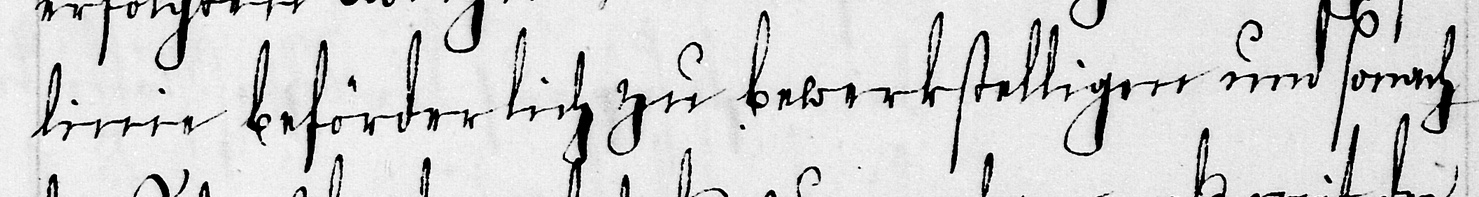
linie beförderlich zu bewerkstelligen und sonach
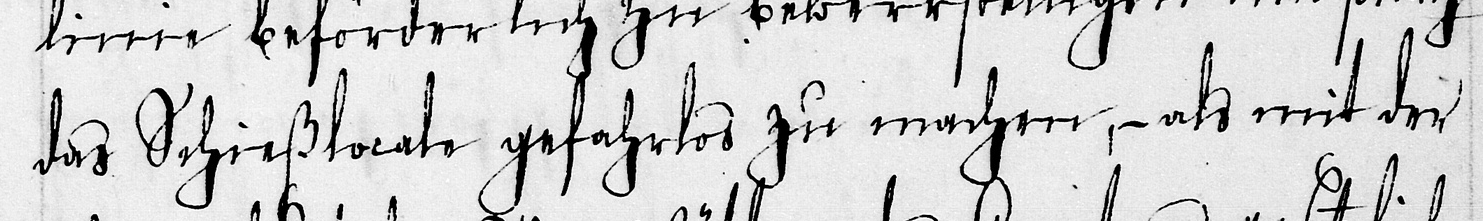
das Schießlocale gefahrlos zu machen, – als mit der
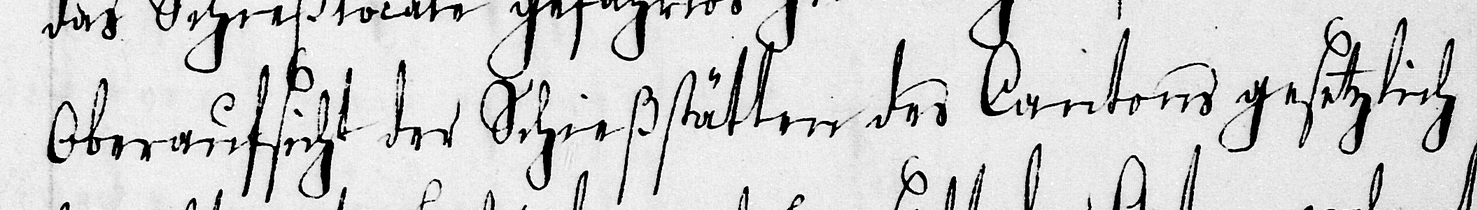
Oberaufsicht der Schießstätten des Cantons gesetzlich
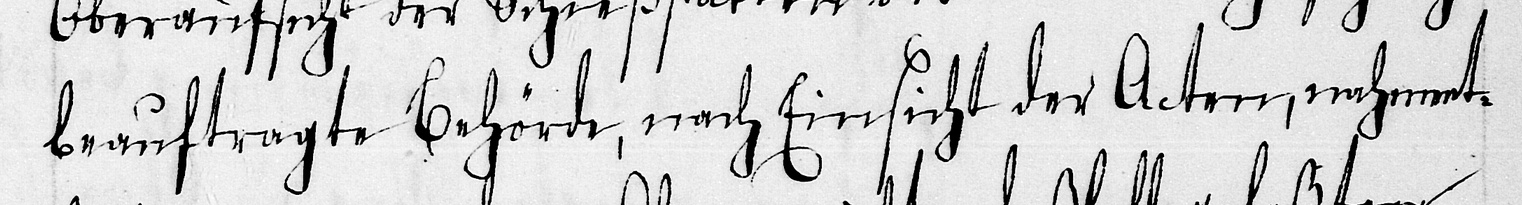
beauftragte Behörde, nach Einsicht der Acten, nahment¬
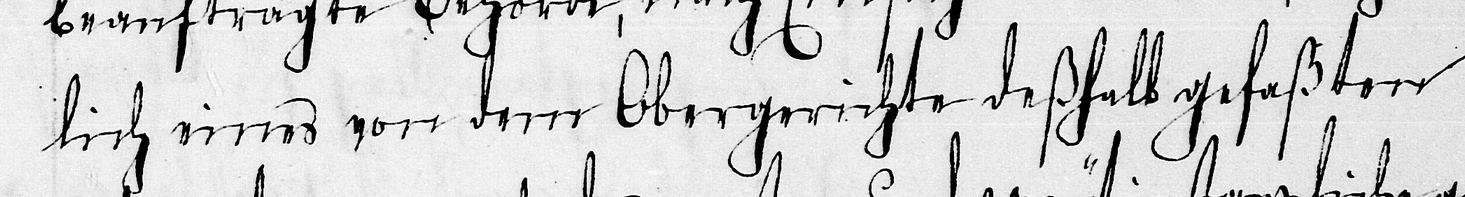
lich eines von dem Obergerichte deßhalb gefaßten
